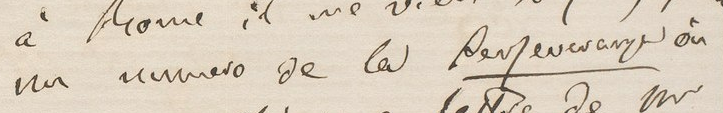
un numero de la Perseveranza où
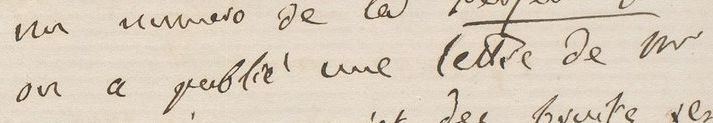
on a publiè une lettre de Mr
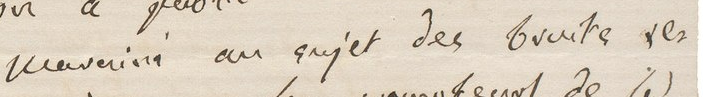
Maraini au sujet des bruits re-
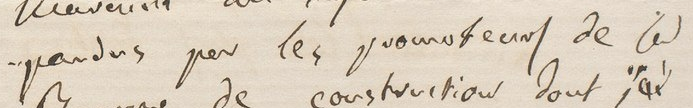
pandus par les promoteurs de la
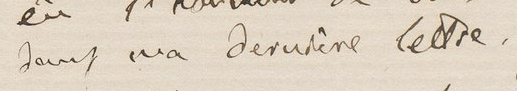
dans ma dernière lettre.
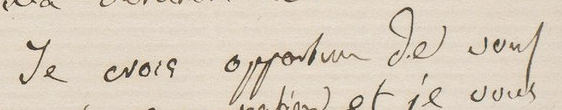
Je crois opportun de vous
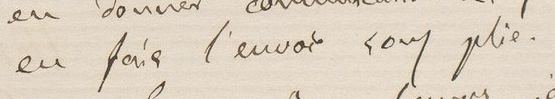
en fais l'envoi sous plis.
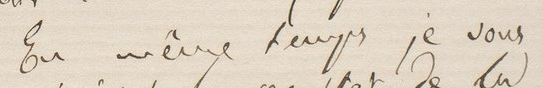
En même temps je vous
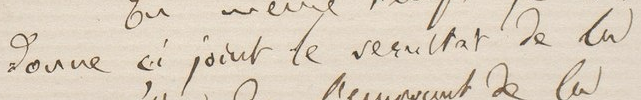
donne ci joint le resultat de la
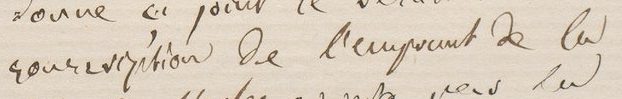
souscription de l'emprunt de la
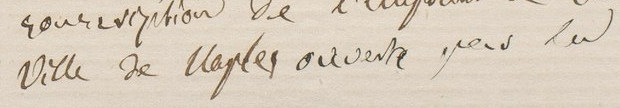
Ville de Naples ouverte par la
